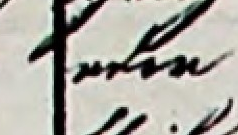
oder
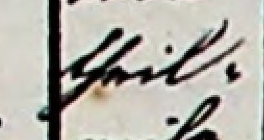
theil„
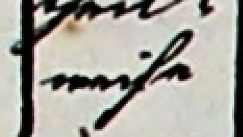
weise
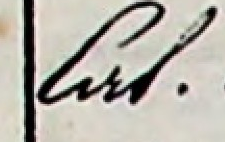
Cat.
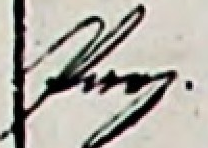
Parz.
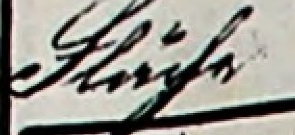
Fläche
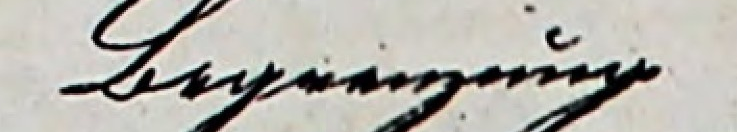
Begrenzung
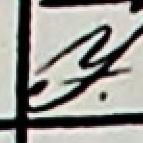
J.
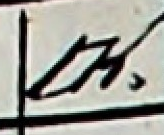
Ck.
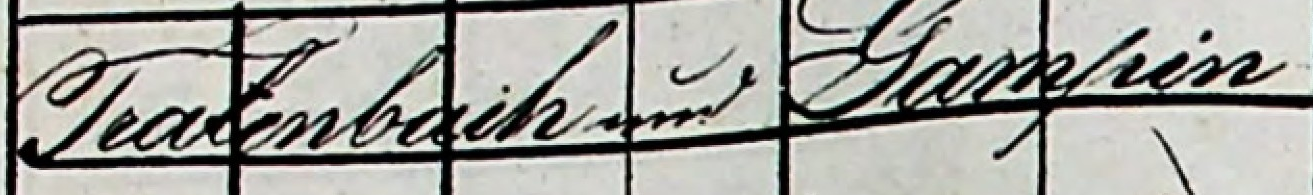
Tratenbach und Gampin
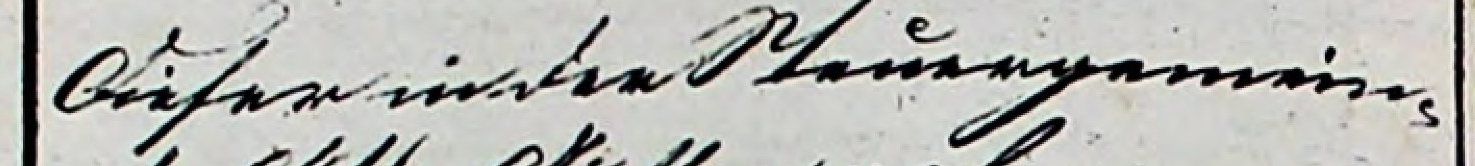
Dieser in der Steuergemein„
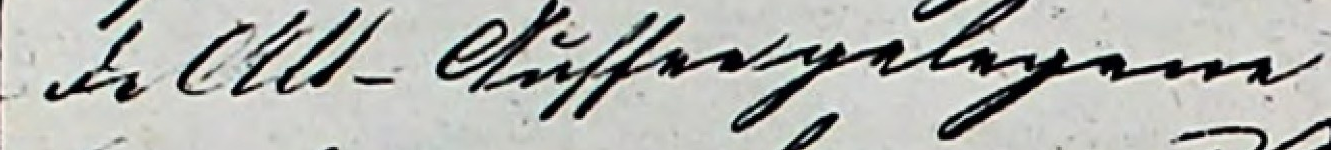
de Alt - Aussee gelegene
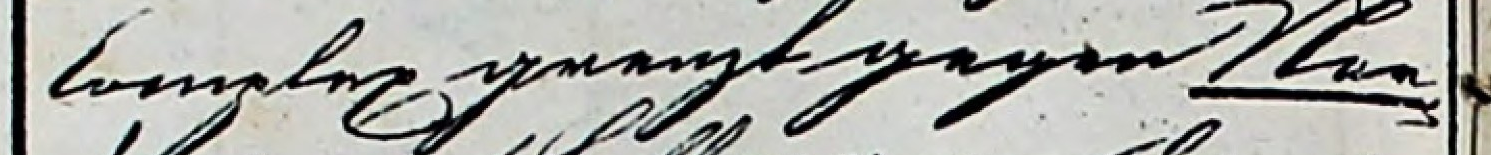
Complex grenzt gegen Nor„
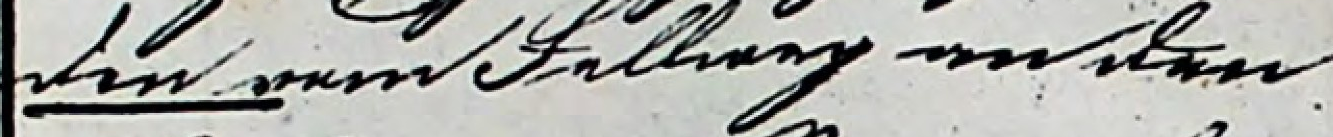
den vom Fellweg an den
